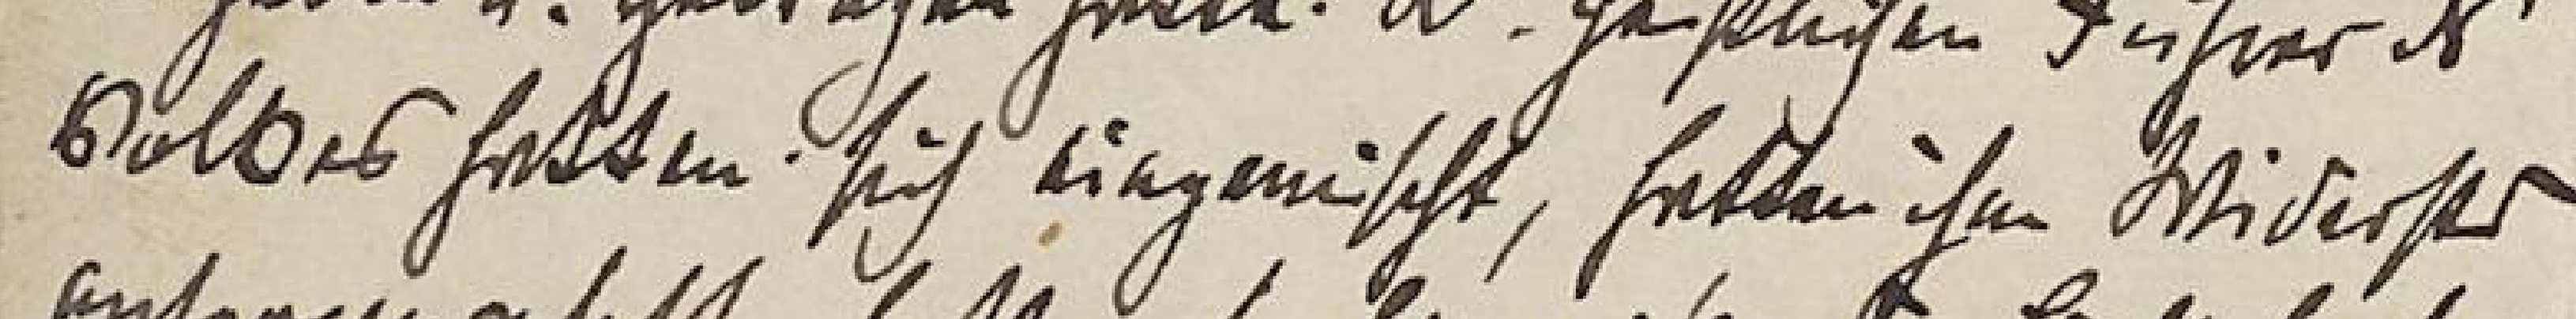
Volkes hatten sich eingemisch, hatten ihm Widerstd
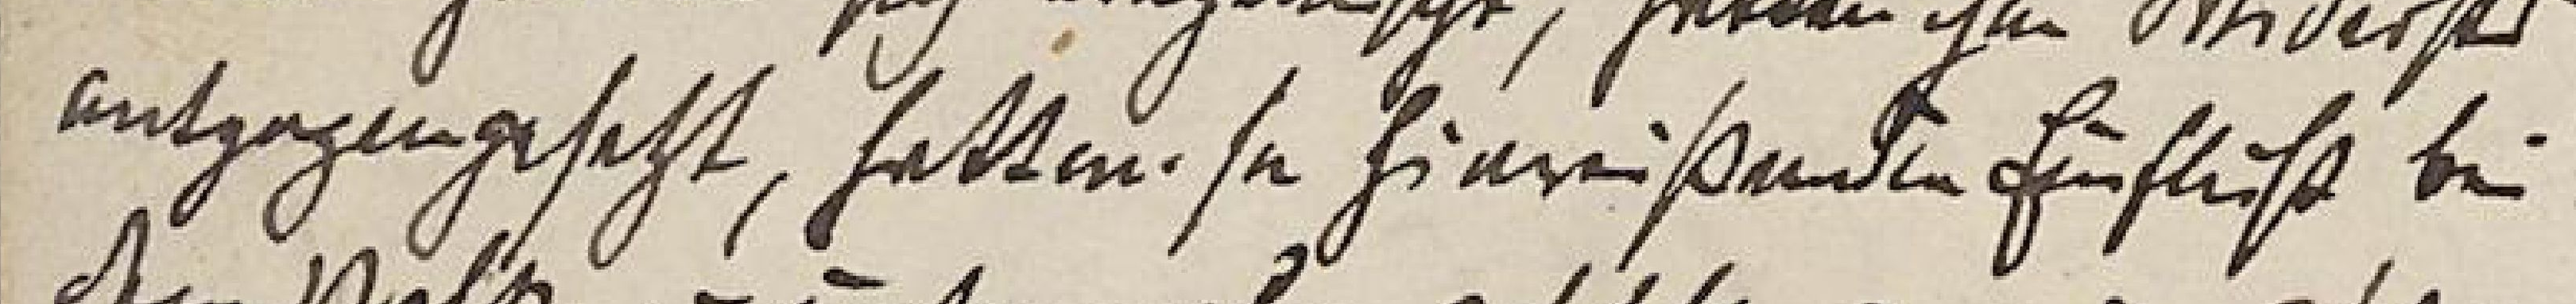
entgegengesetzt, hatten. sn hinreißenden Einfluß bei
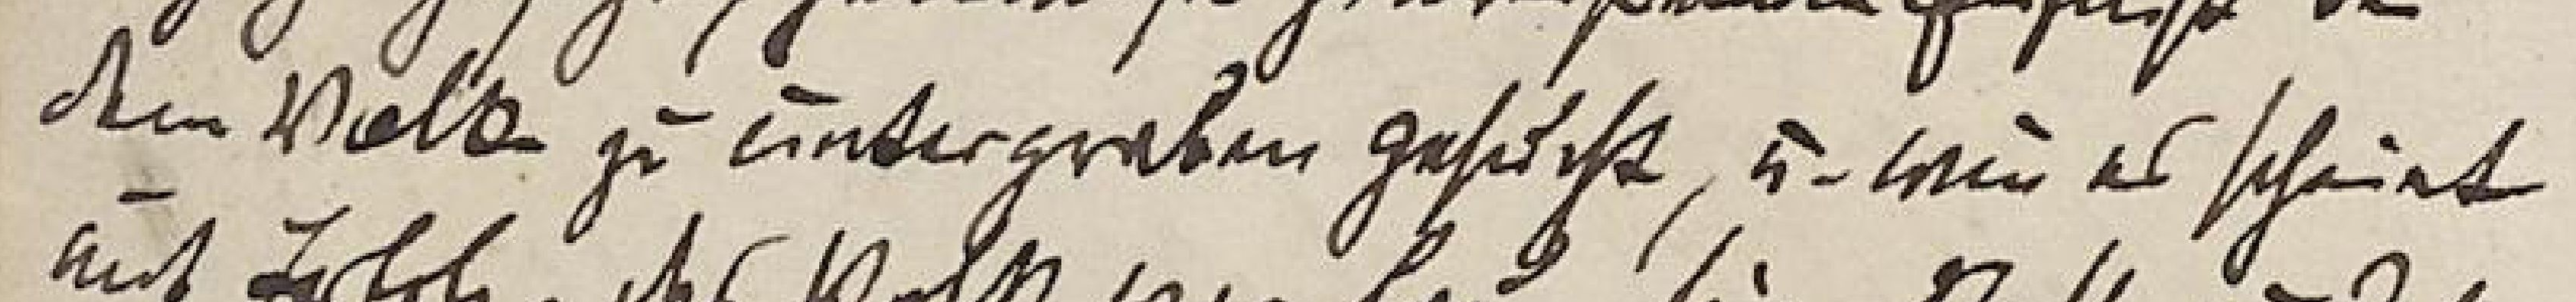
dem Volke zu untergraben gesucht, u. wie es scheint
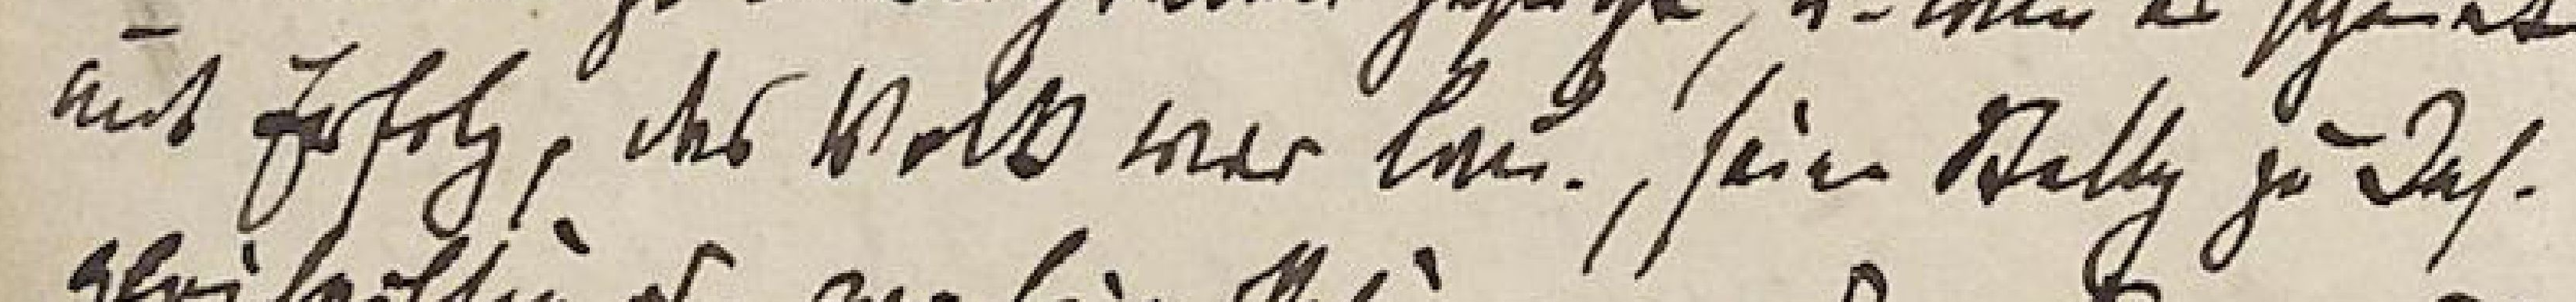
mit Erfolg, das Volk war lau., seine Stellg zu Jes.
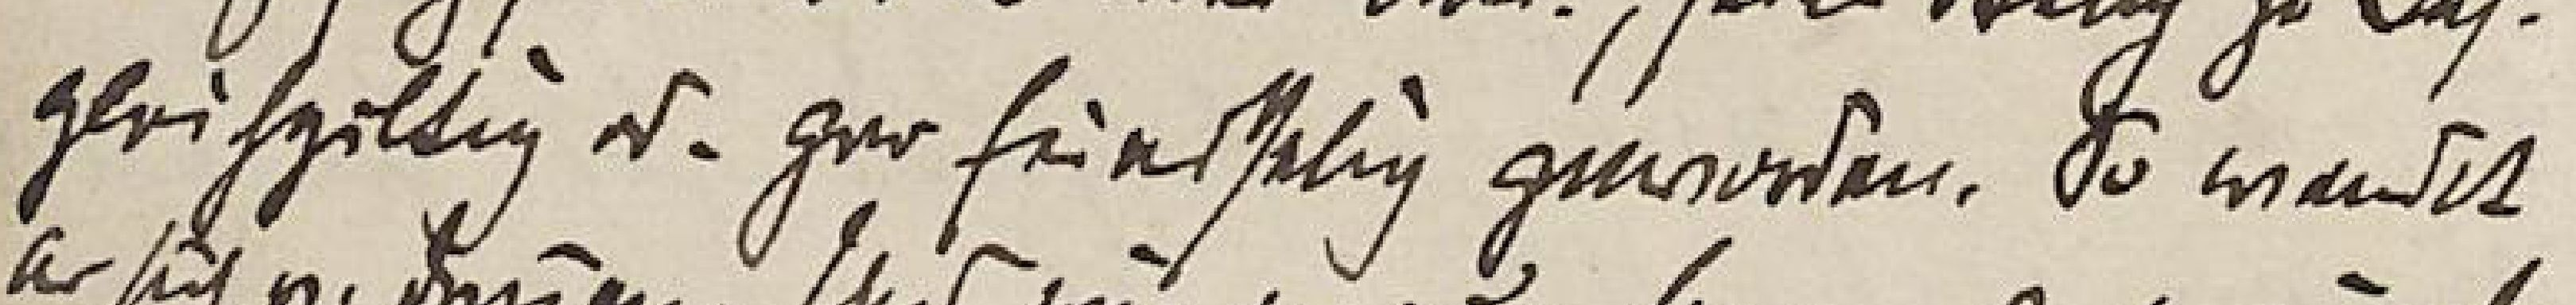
gleichgültig od. gar feindselig geworden. So wendet
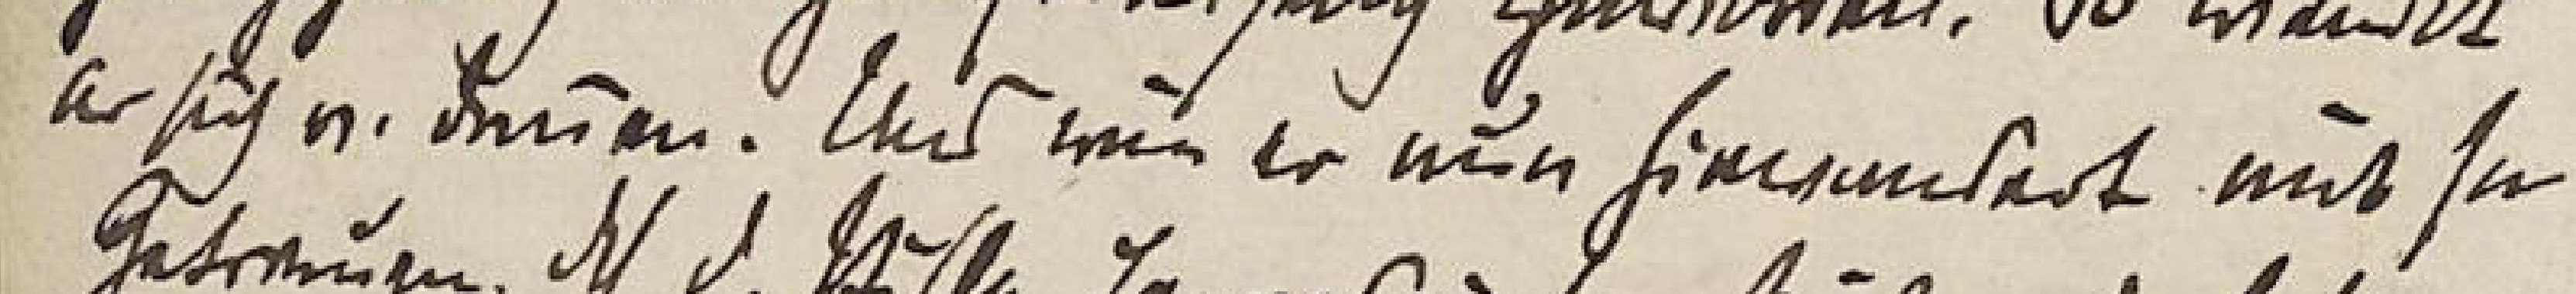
er sich v. danen. Und wie er nun hinwandert mit sn
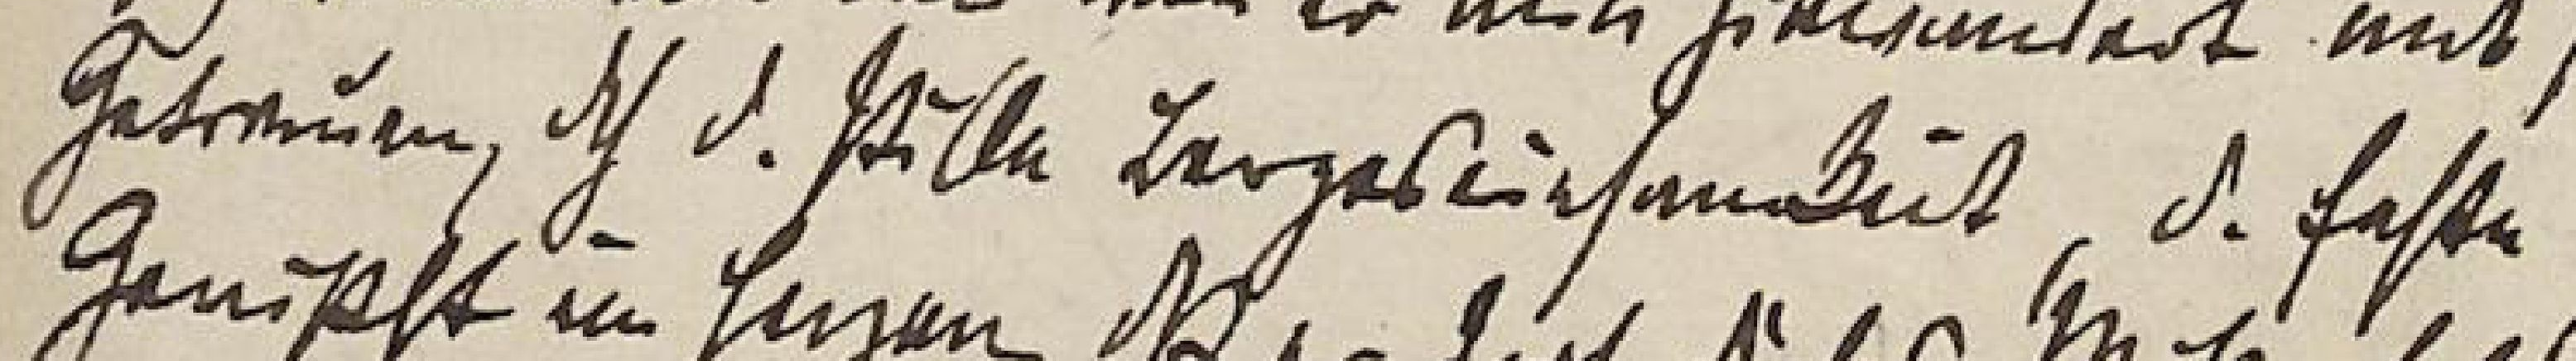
Getreuen, dach d. stille Bergeseinsamkeit, d. feste
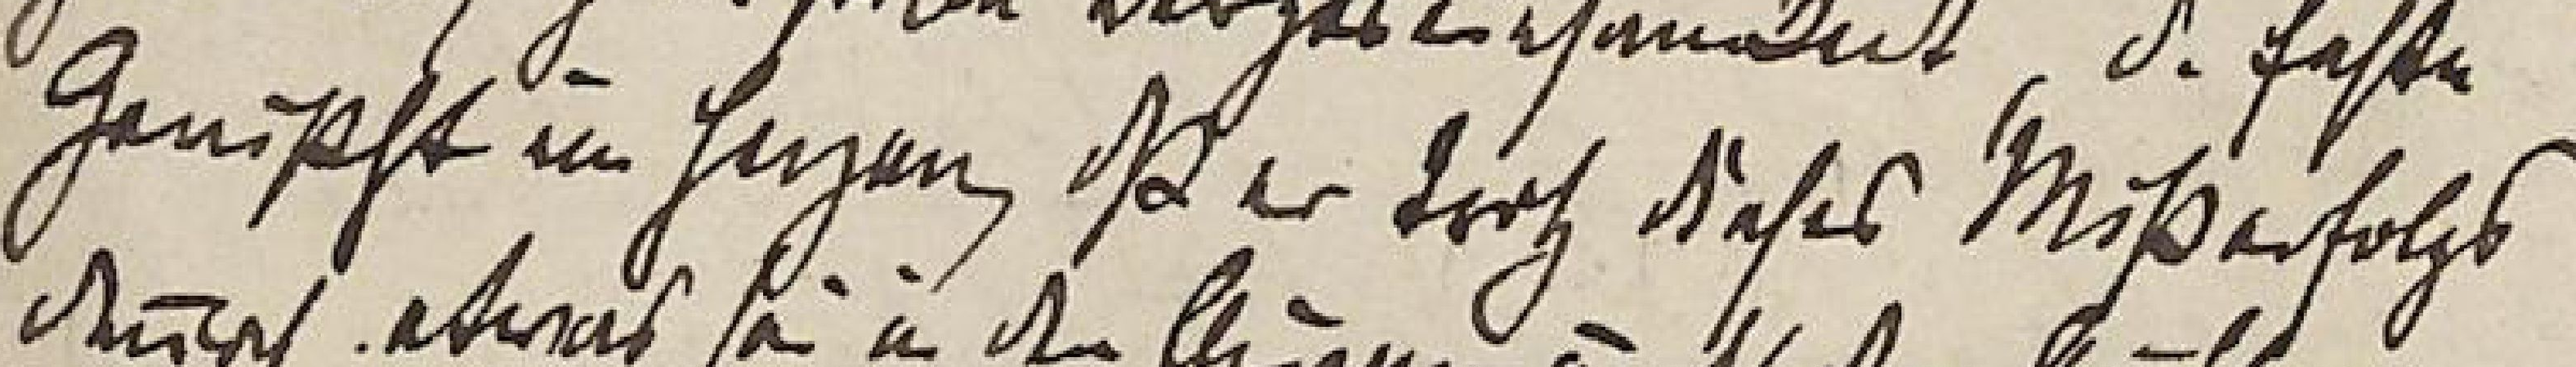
Gewißht im Herzen, dß er trotz diese Mißerfolgs
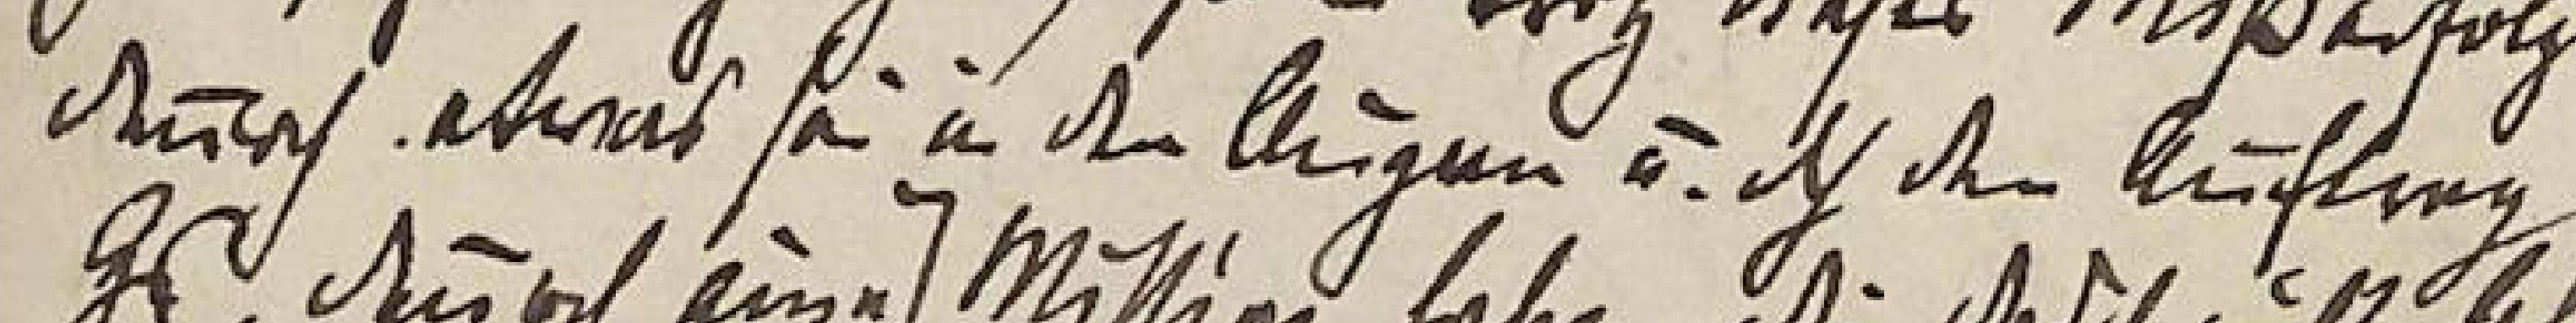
denoch. etwas sei in den Augen u. dch den Auftrag
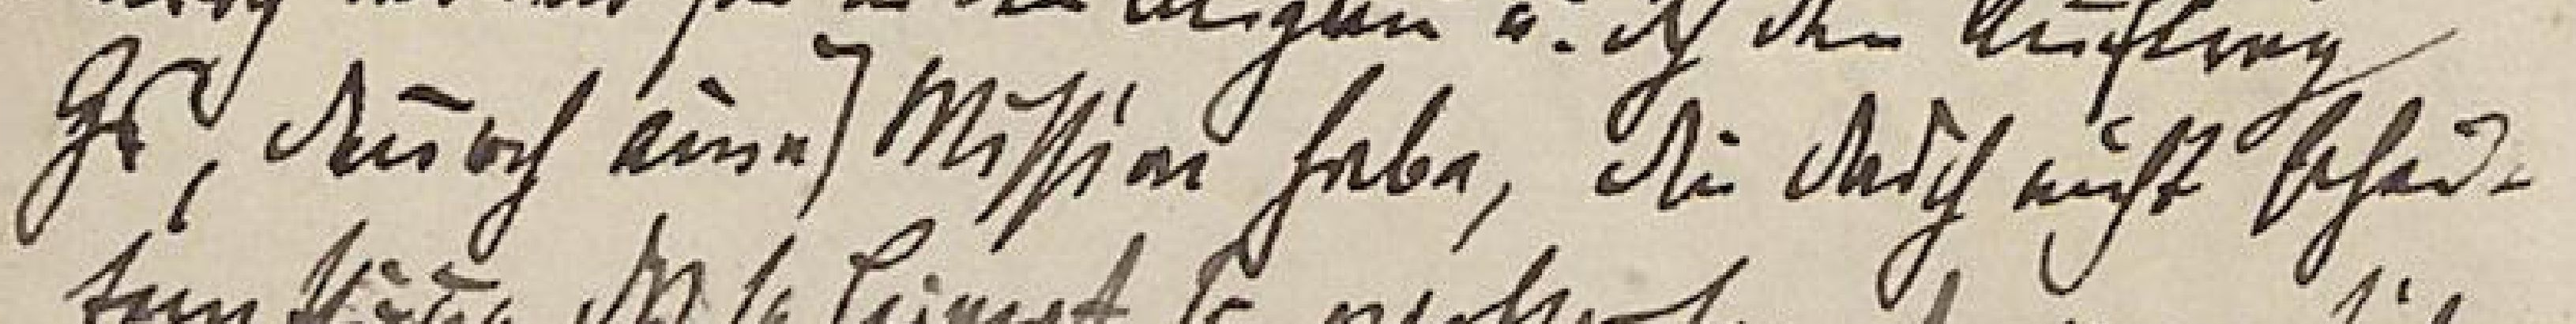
Gs, denoch eine ] Mission habe, die dadch nicht schei¬
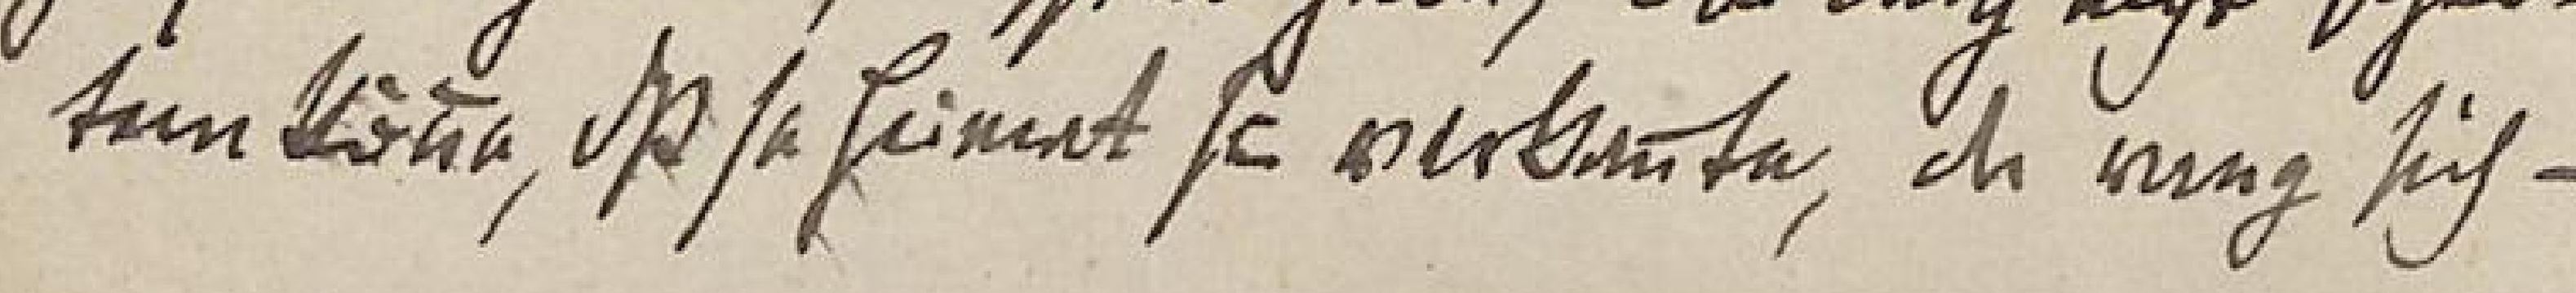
tern köne, daß sn Heimat ihn verkante, da rang sich
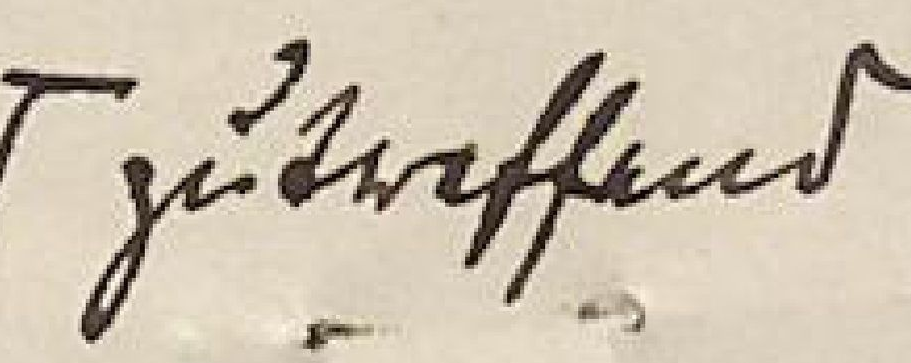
zutreffend
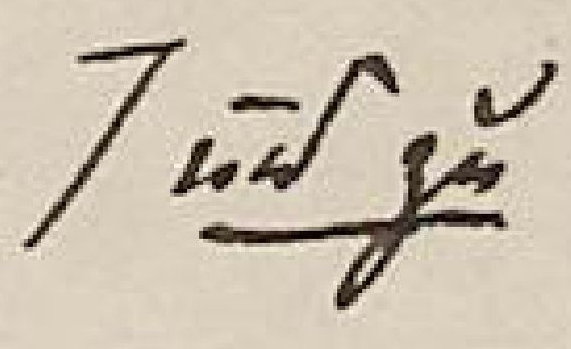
und zu
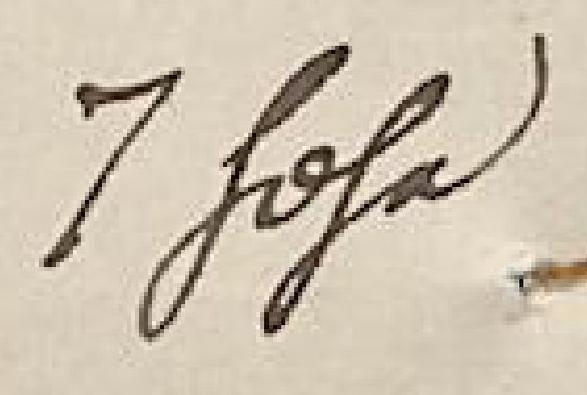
] hohe
